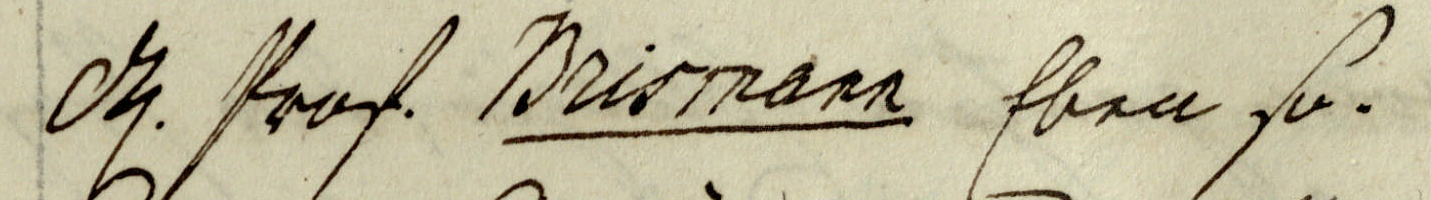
dh. Prof. Brismann Eben so.
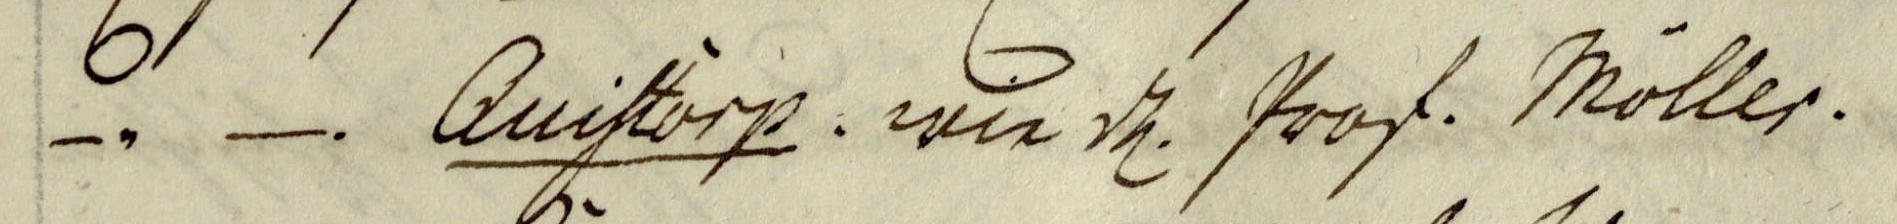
— " — . Quistorp. wie dh. Prof. Möller.
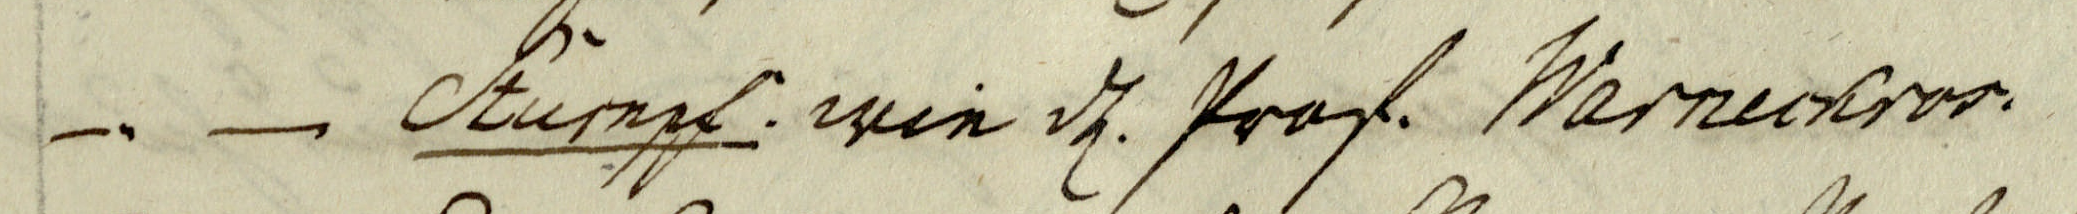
— " — . Stumpf. wie dh. Prof. Warneckros.
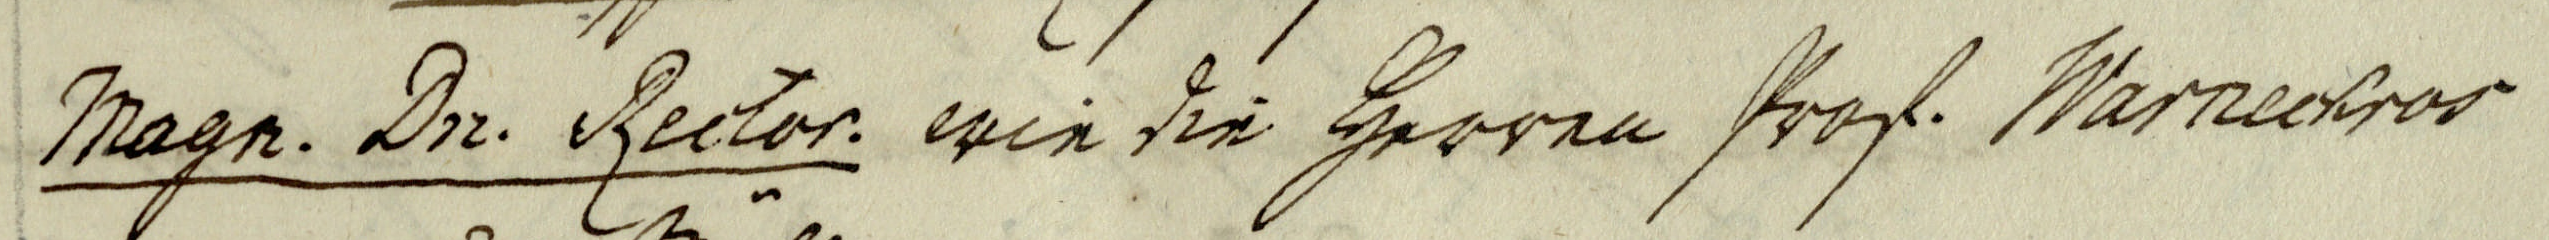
Magn. Dn. Rector. wie die Herren Prof. Warneckros
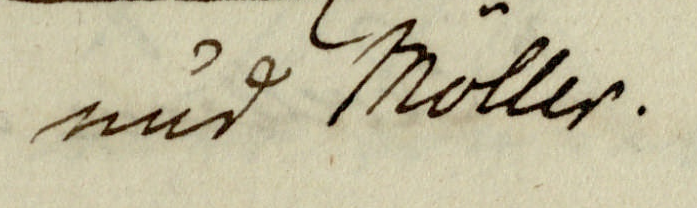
und Möller.
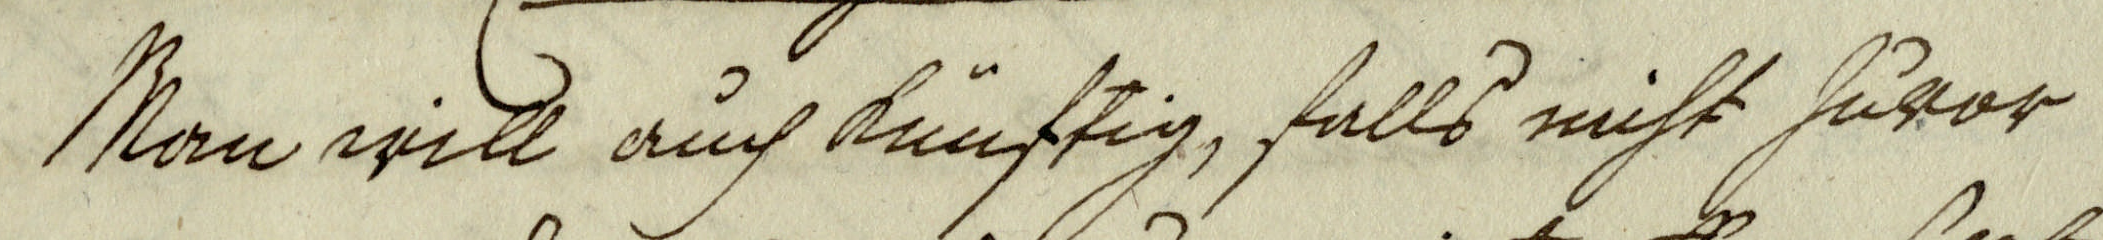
Man will auch künftig, falls nicht zuvor
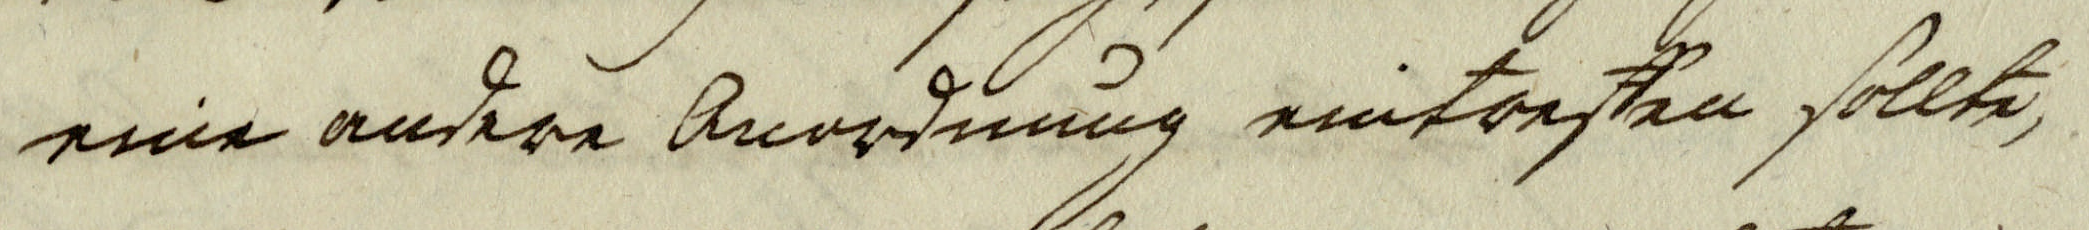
eine andere Anordnung eintreffen sollte,
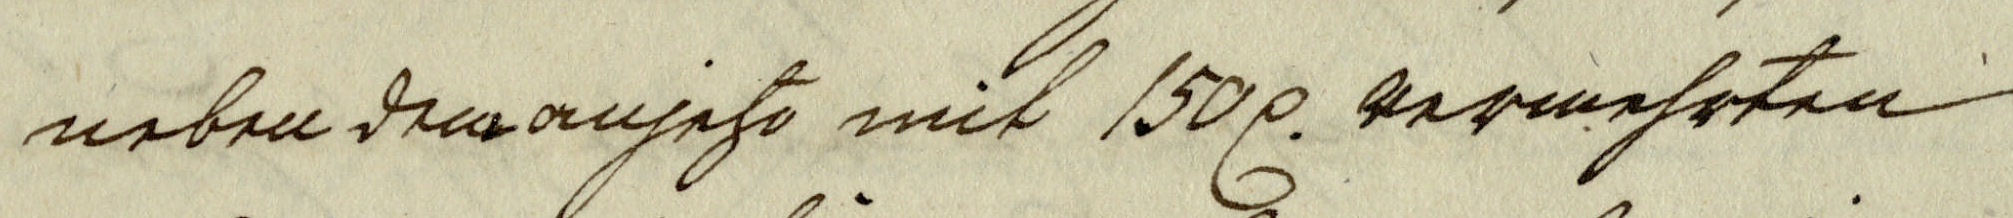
neben dem anjetzo mit 150 rtl. vermehrten
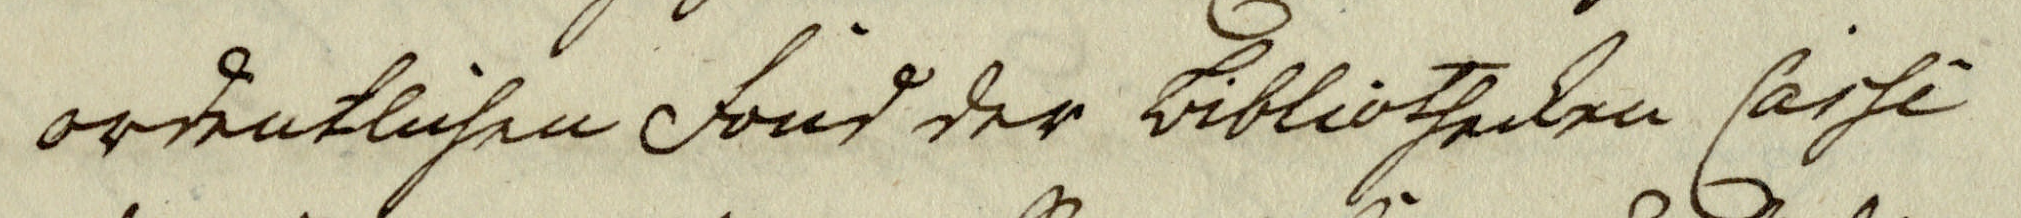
ordentlichen Fond der Bibliotheken Casse
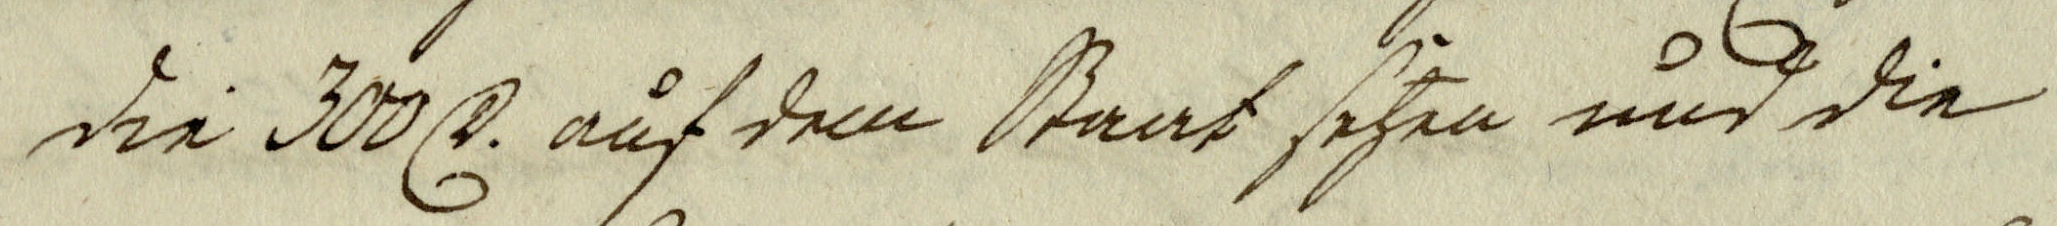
die 300 rtl. auf dem Staat setzen und die
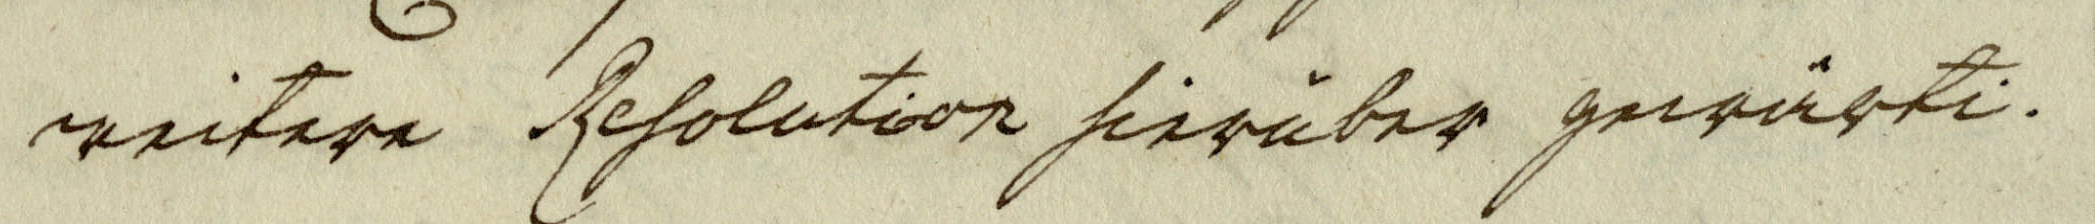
weitere Resolution hierüber gewärti¬
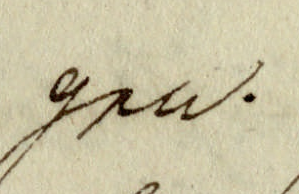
gen.
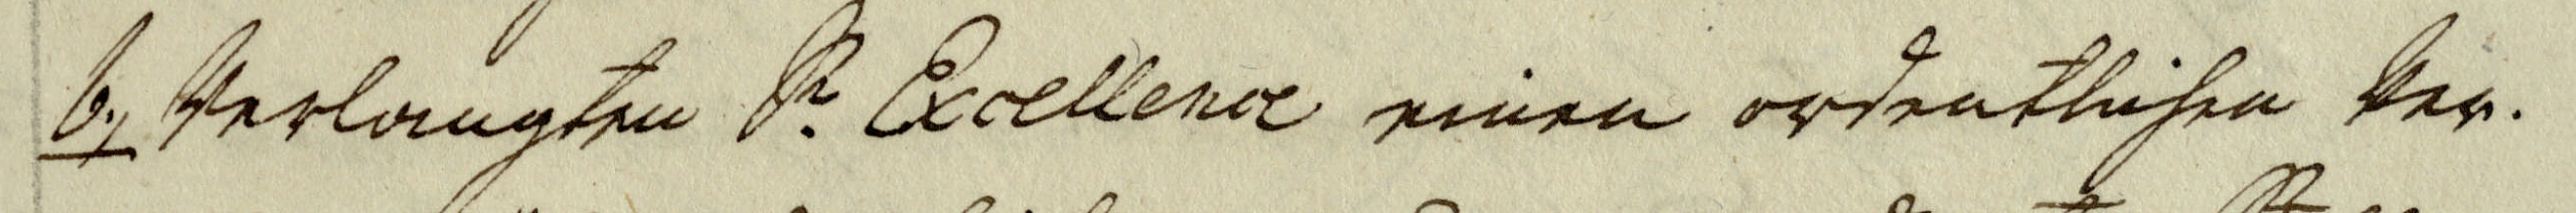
2., Verlangten Sr. Excellence einen ordentlichen Vor¬
